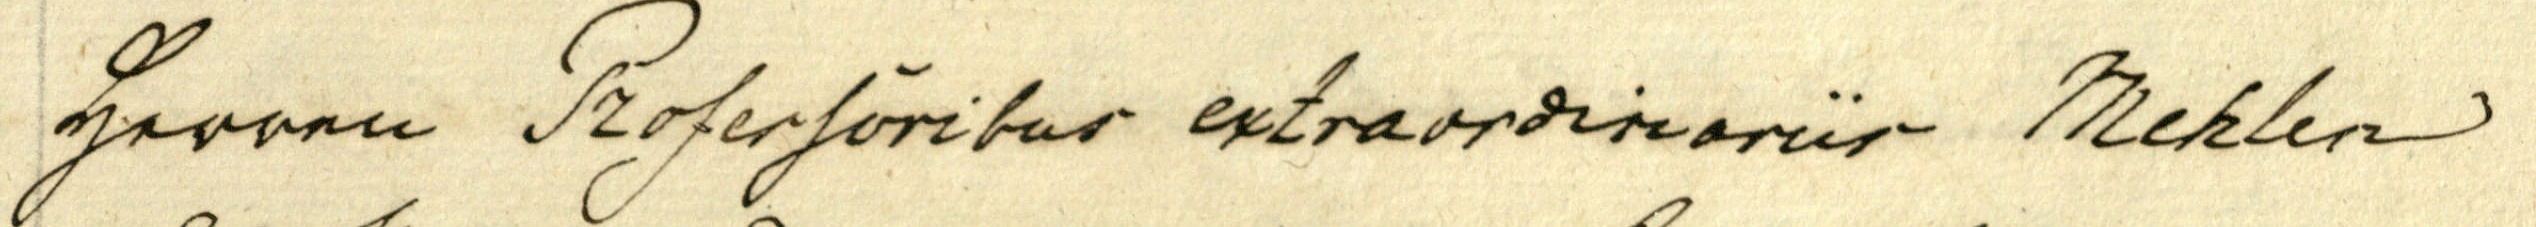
Herren Professoribus extraordinariis Mehlen
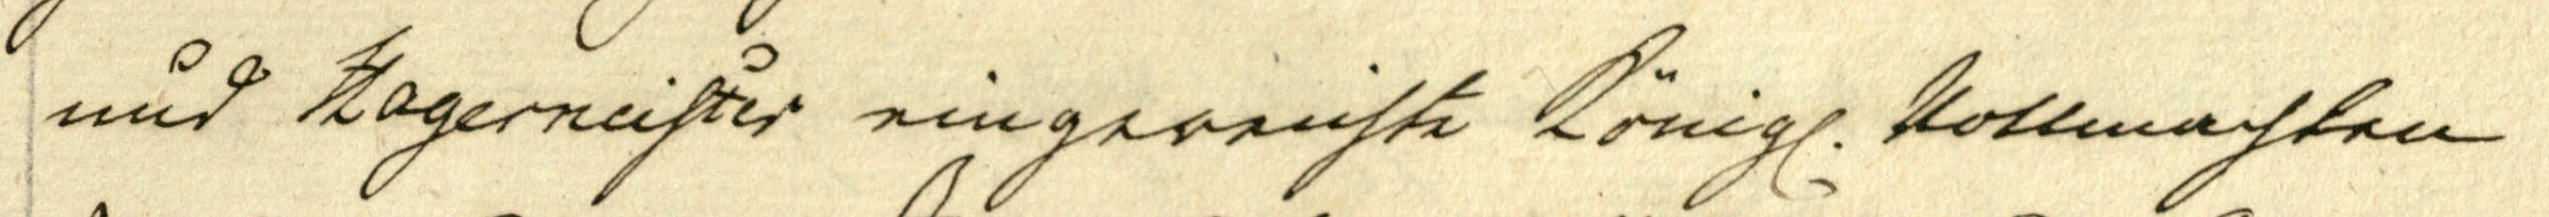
und Hagemeister eingereichte Königl. Vollmachten
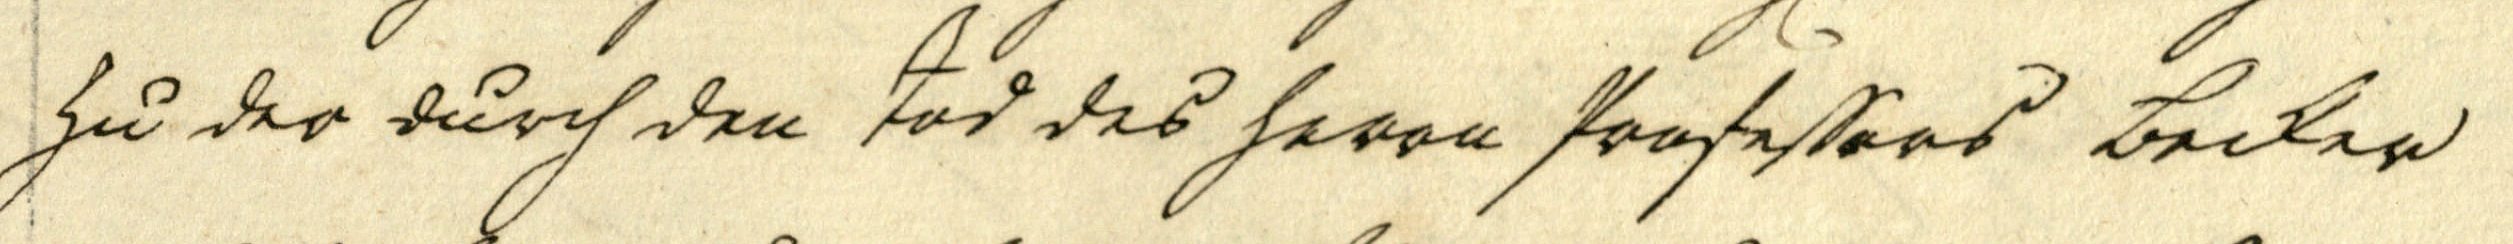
zu der durch den Tod des herrn Professors Becker
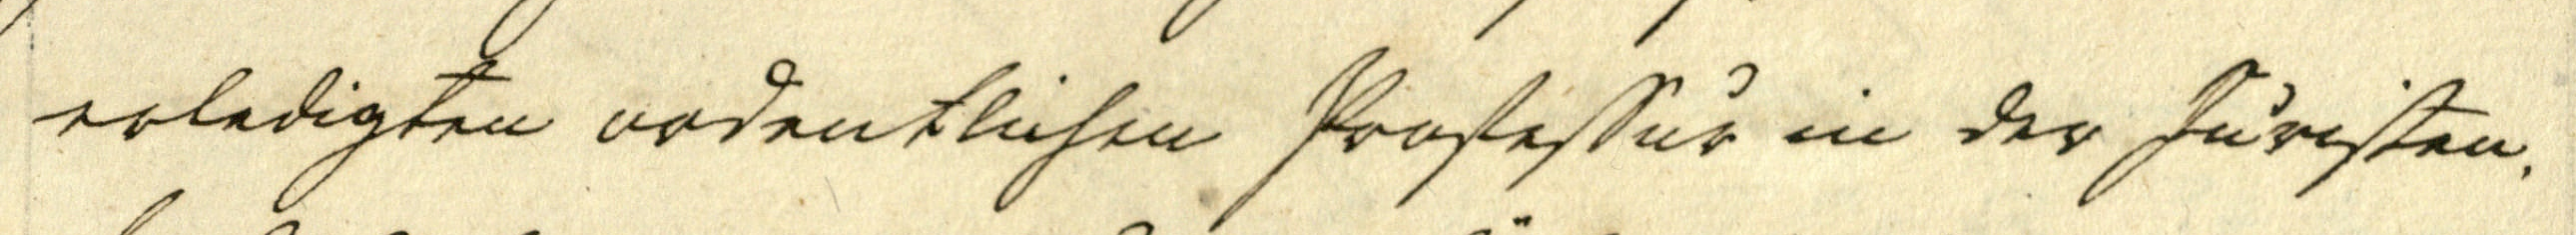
erledigten ordentlichen Professur in der Juristen
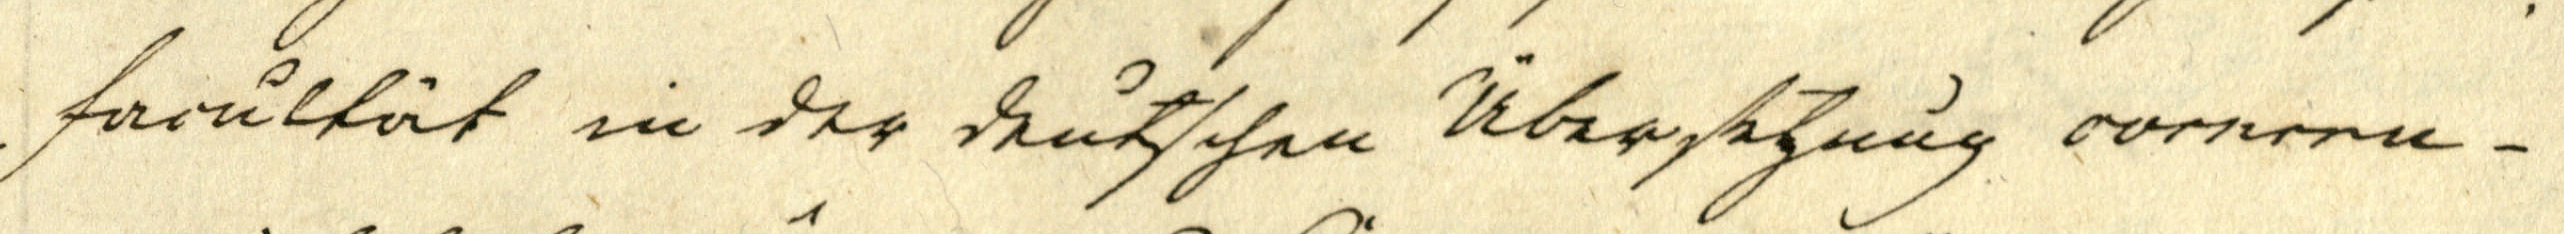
Facultät in der deutschen Übersetzung commu¬
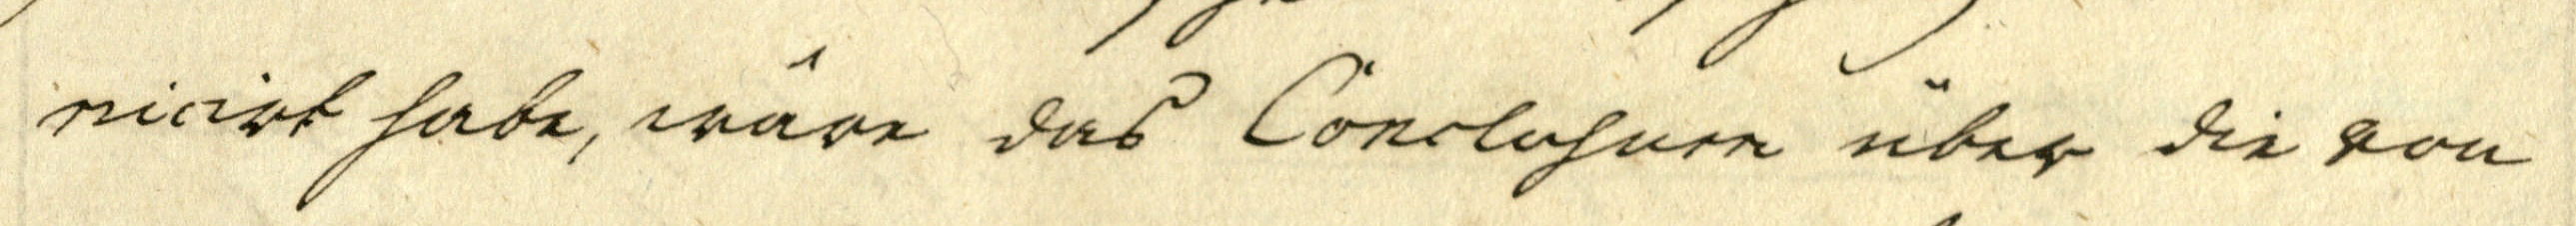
nicirt habe, wäre das Conclusum über die von
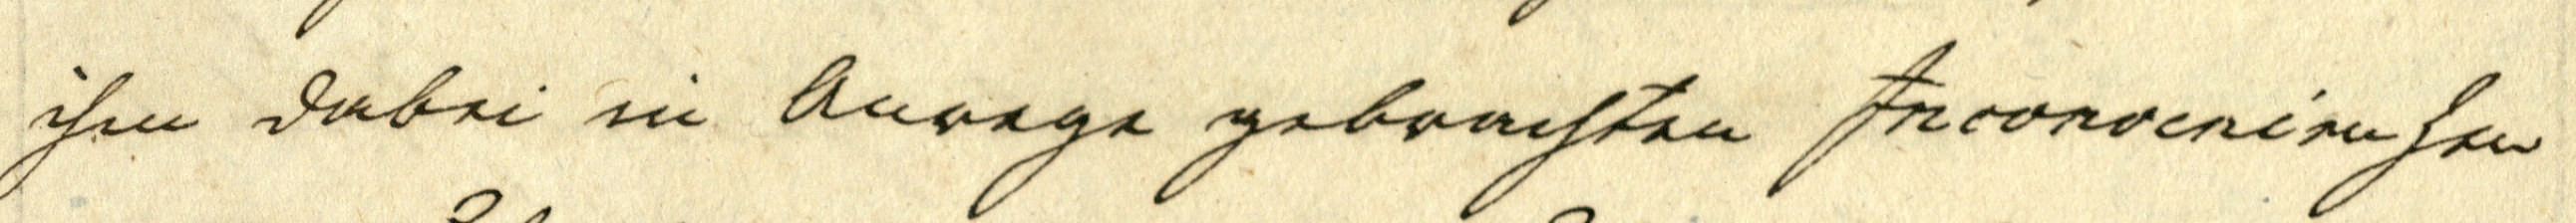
ihm dabei in Anrege gebrachten Inconvenienzen
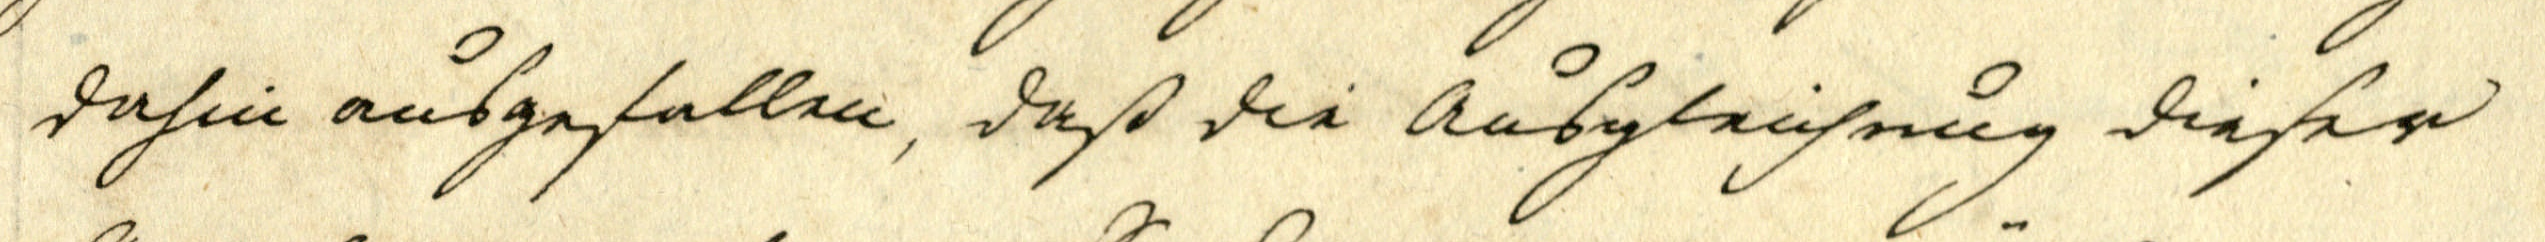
dahin ausgefallen, daß die Ausgleichung dieser
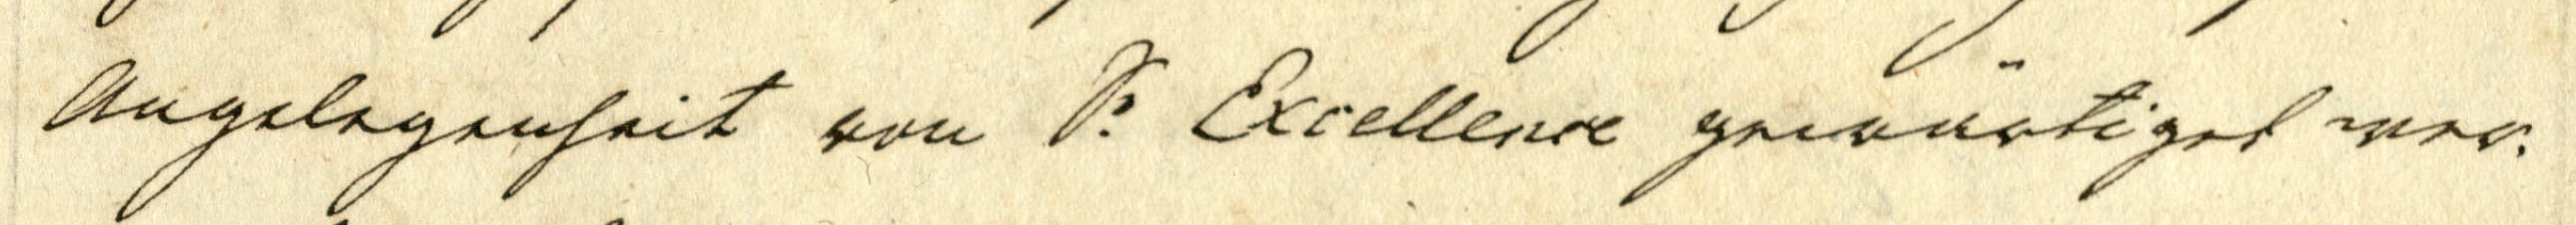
Angelegenheit von Sr. Excellence gewürtiget wer¬
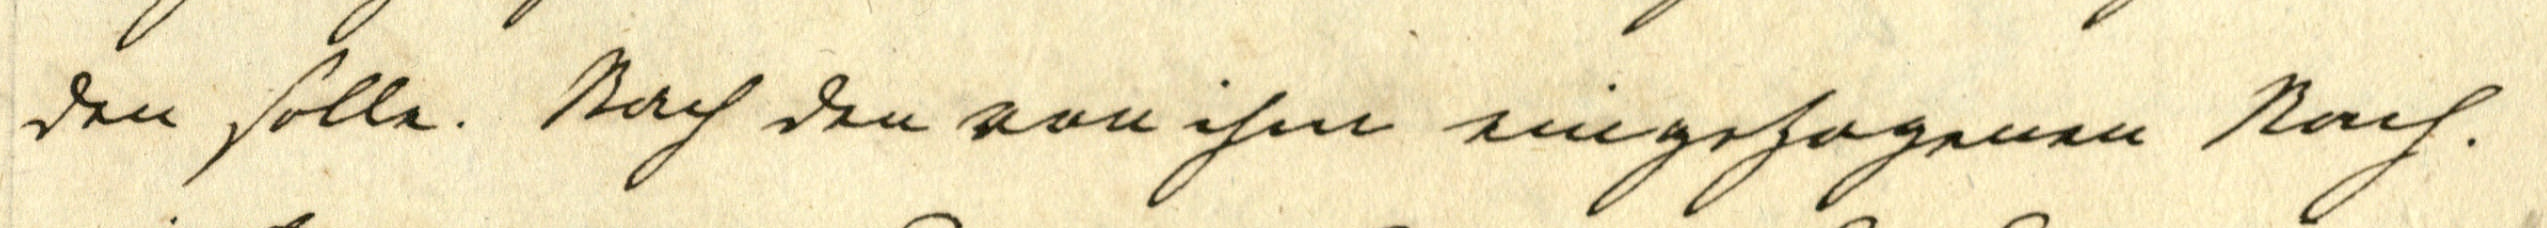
den solle. Nach den von ihm eingezogenen Nach¬
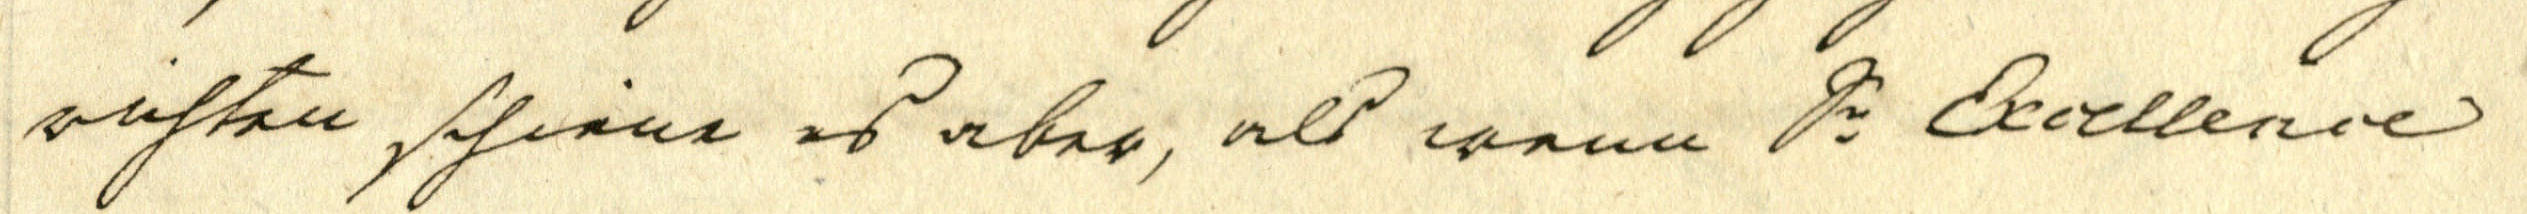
richten schiene es aber, als wenn Sr. Excellence
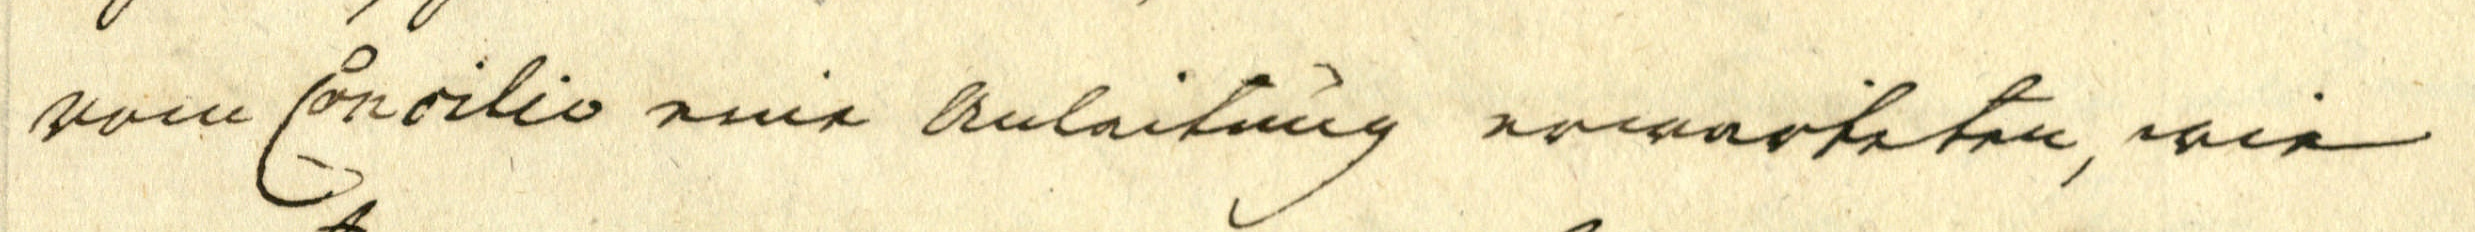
vom Concilio eine Anleitung erwarteten, wie
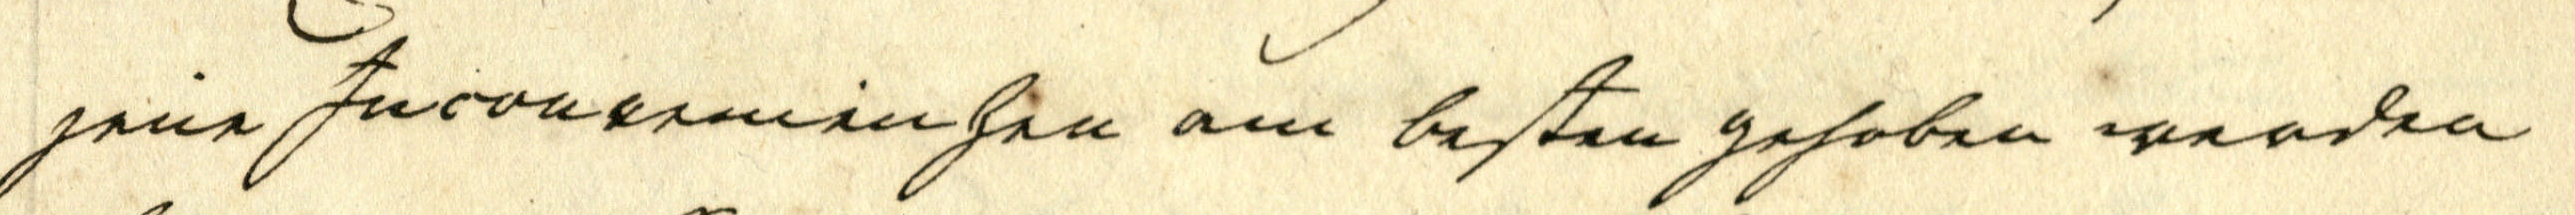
jene Inconvenienzen am besten gehoben werden
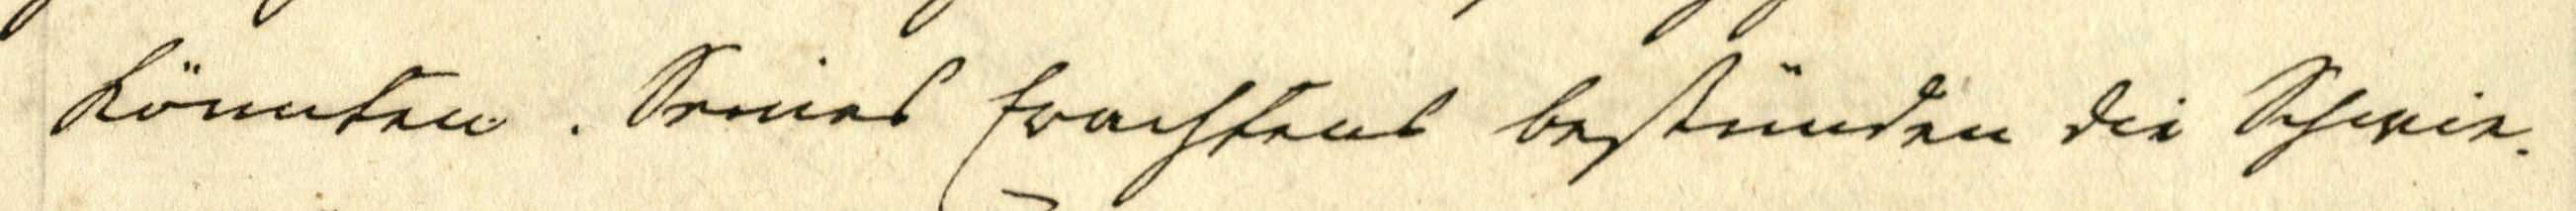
könnten. Seines Erachtens bestünden die Schwie¬
